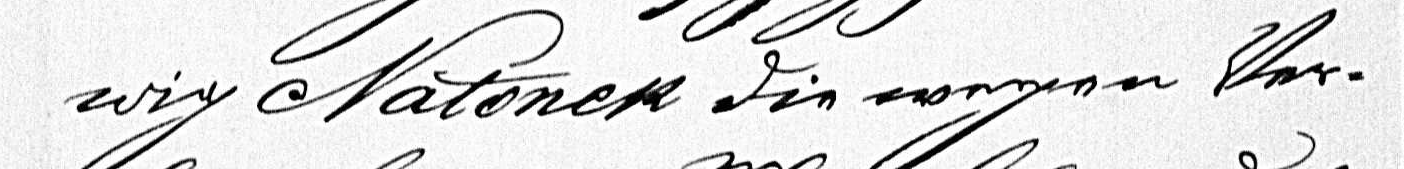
wig Natonek die wegen Ver¬
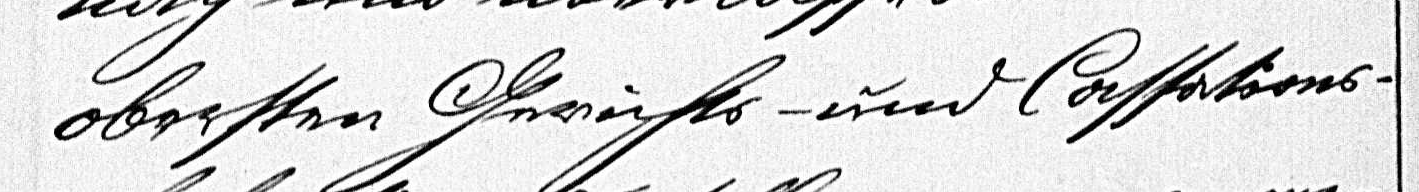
Obersten Gerichts- und Cassations¬
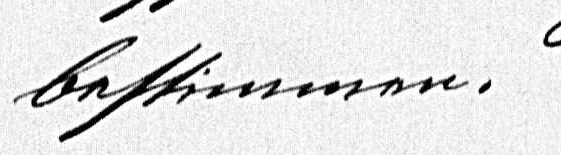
bestimmen.
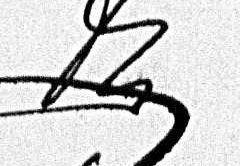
FJ
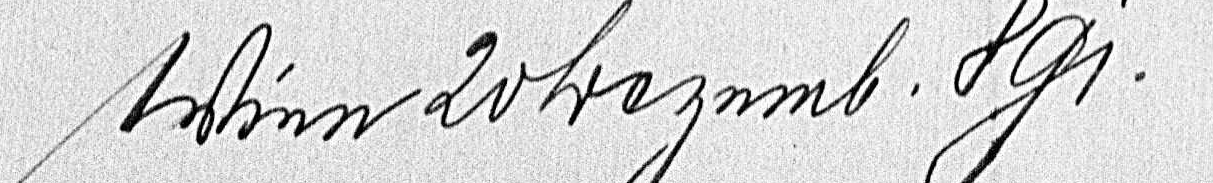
Wien, 20. Dezemb. 891
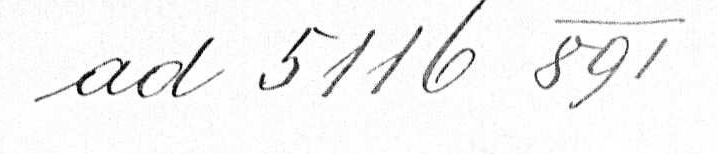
ad 5116 1891
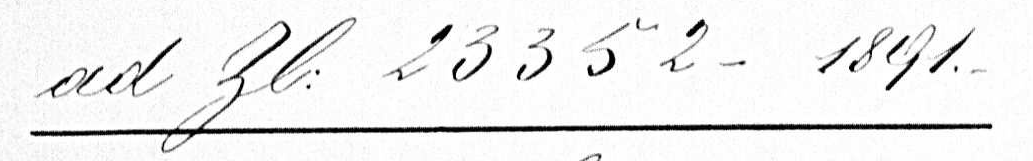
ad Z. 23352 – 1891/
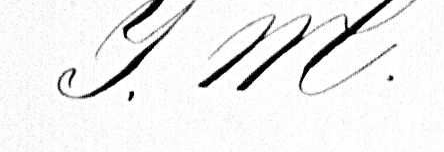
JM
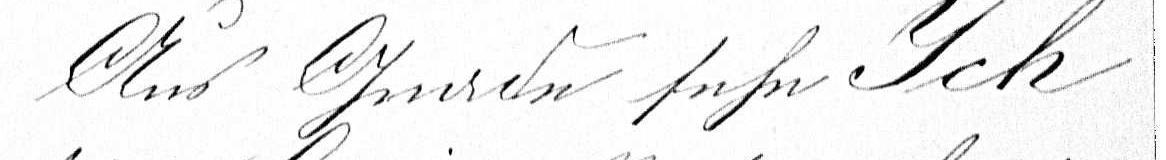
Aus Gnade sehe Ich
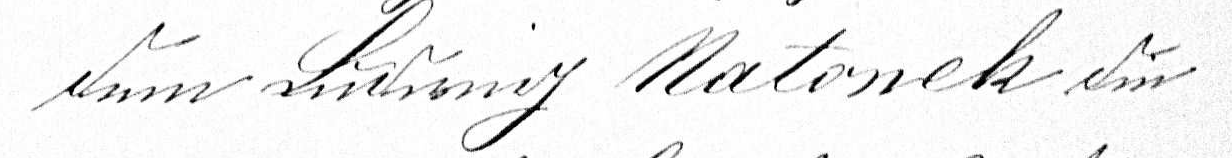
dem Ludwig Natonek die
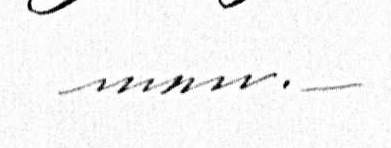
men.
